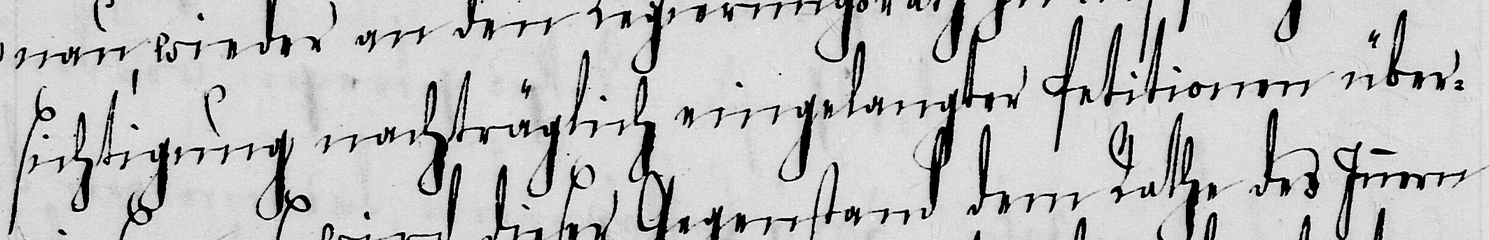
sichtigung nachträglich eingelangter Petitionen über¬
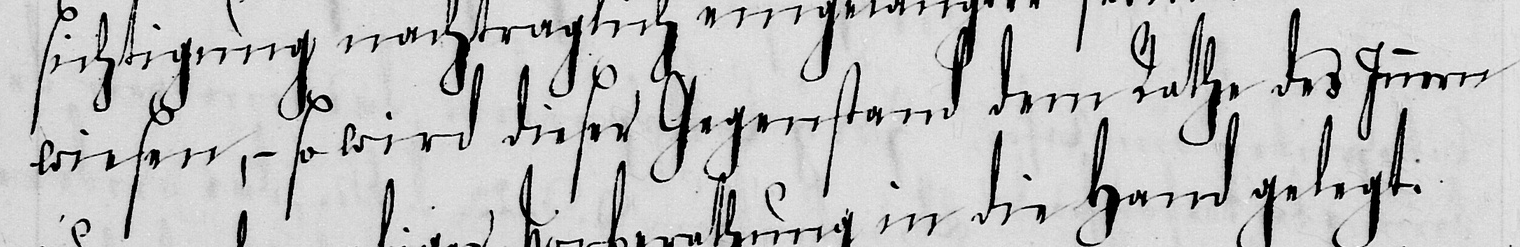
wiesen, – so wird dieser Gegenstand dem Rathe des Innern
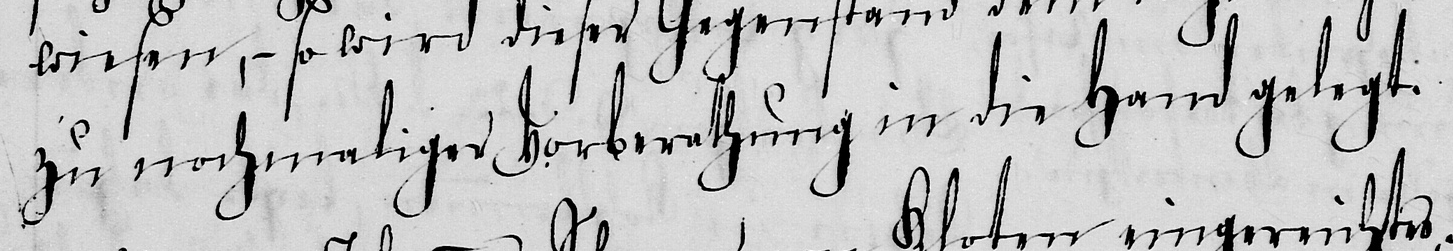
zu nochmaliger Vorberathung in die Hand gelegt.
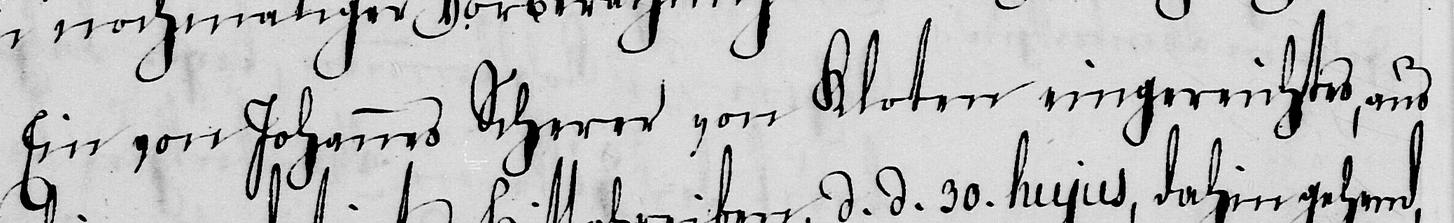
Ein von Johannes Scherer von Kloten eingereichtes, aus
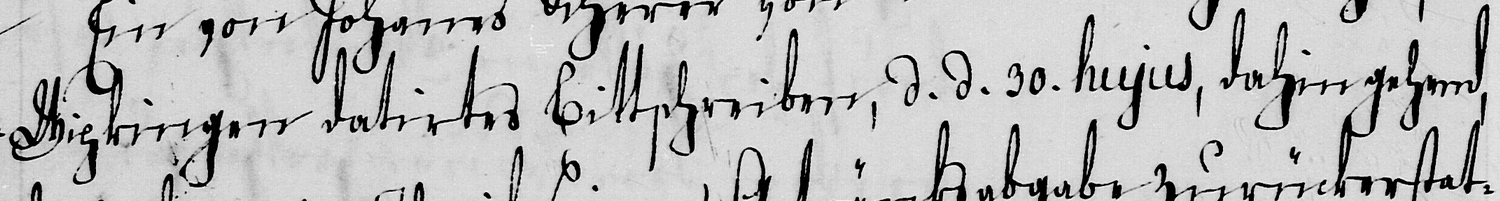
Wipkingen datirtes Bittschreiben, d. d. 30. hujus, dahingehend,
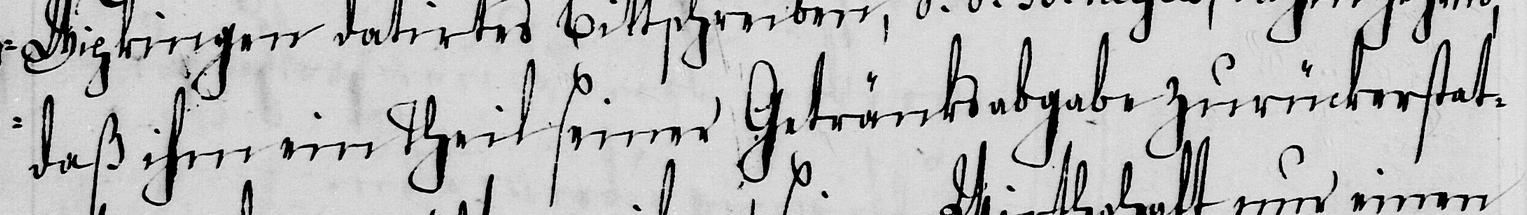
daß ihm ein Theil seiner Getränksabgabe zurückerstat¬
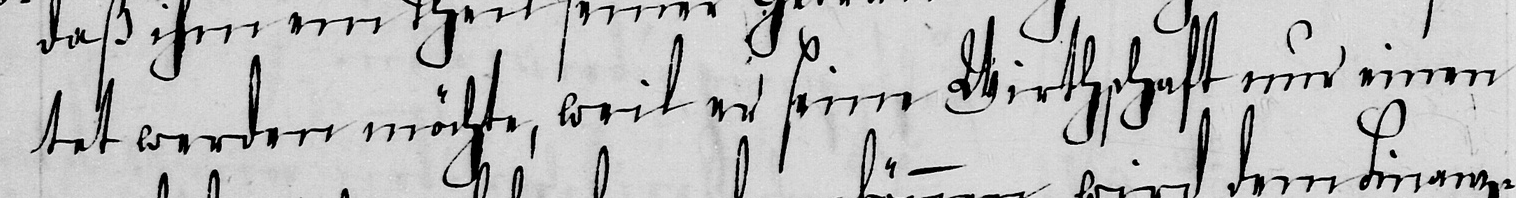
tet werden möchte, weil er seine Wirthschaft nur einen
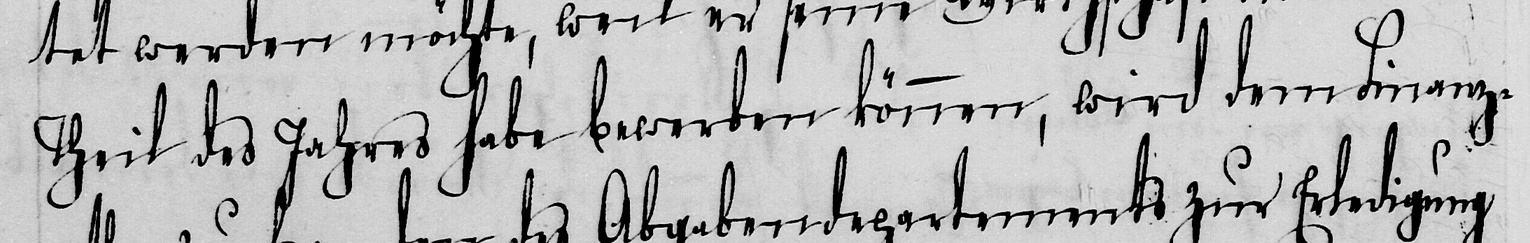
Theil des Jahres habe bewerben können, wird dem Finanz¬
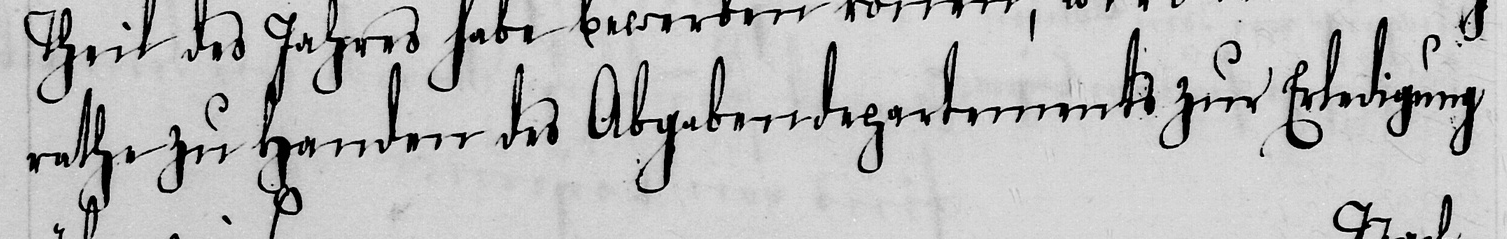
rathe zu Handen des Abgabendepartementes zur Erledigung
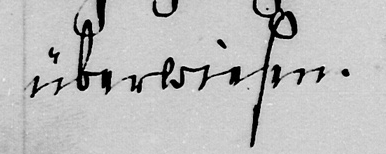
überwiesen.
